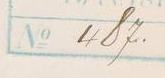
Januar 1872.
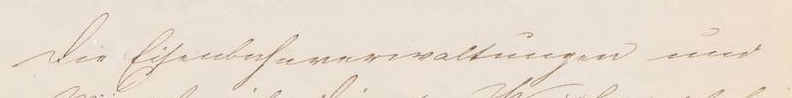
Die Eisenbahnverwaltungen und
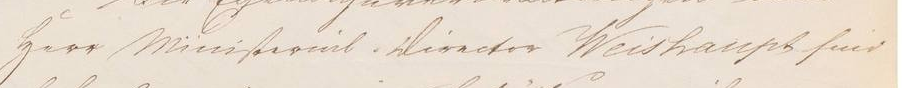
Herr Ministerial-Director Weishaupt sind
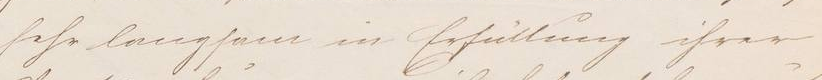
sehr langsam in Erfüllung ihrer
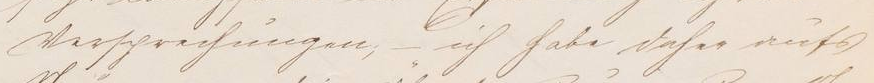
Versprechungen, – ich habe daher aufs
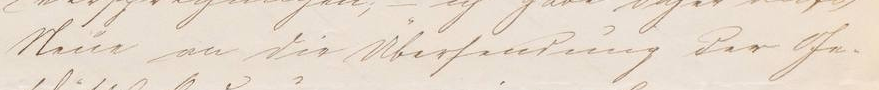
Neue an die Übersendung der Ge-
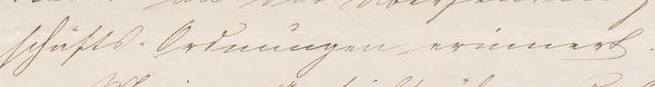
schäfts-Ordnungen erinnert.
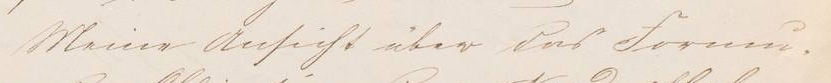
Meine Ansicht über das Formu-
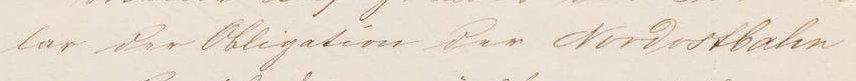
lar der Obligation der Nordostbahn
